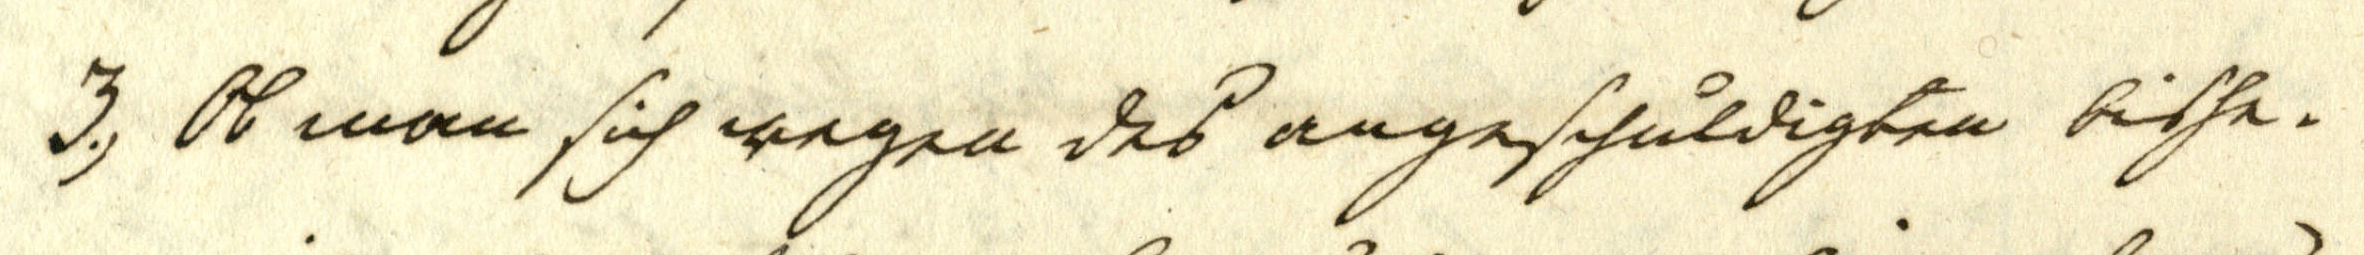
3., Ob man sich wegen des angeschuldigten bishe¬
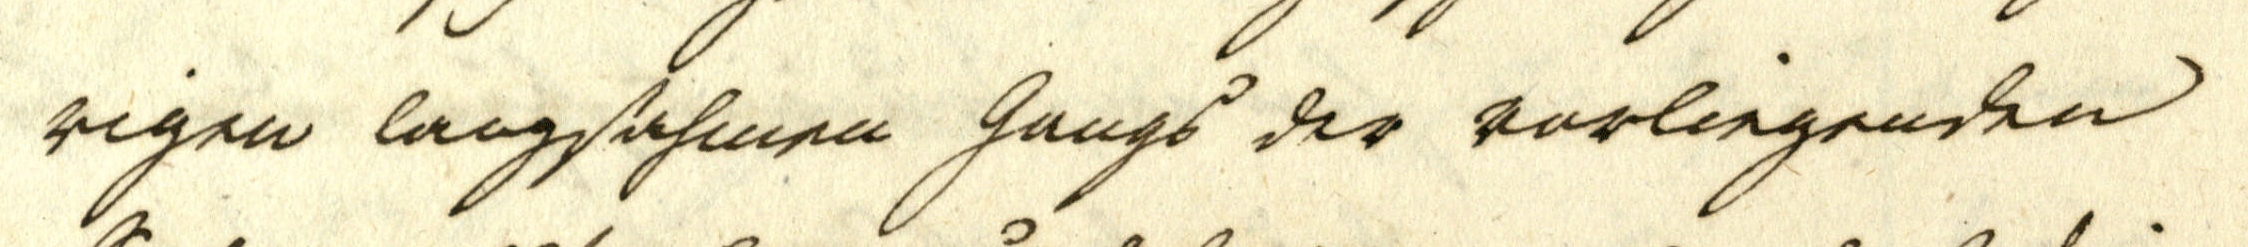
rigen langsahmen Gangs der vorliegenden
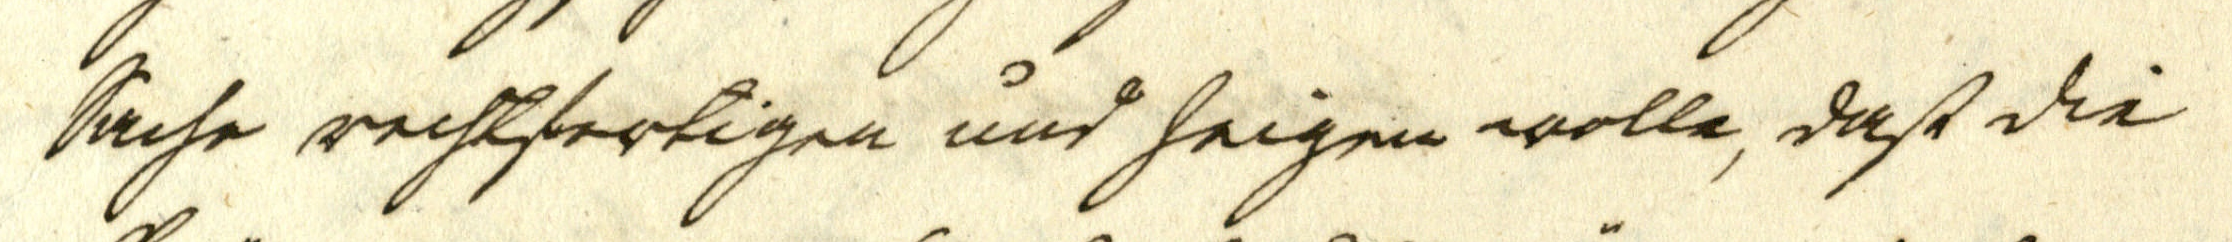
Sache rechtfertigen und zeigen wolle, daß die
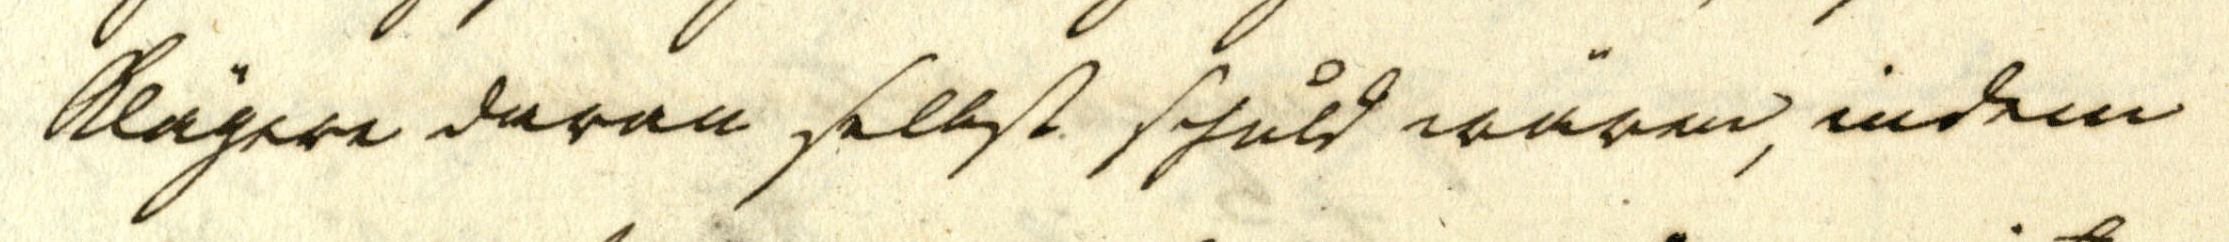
Klägere daran selbst schuld wären, indem
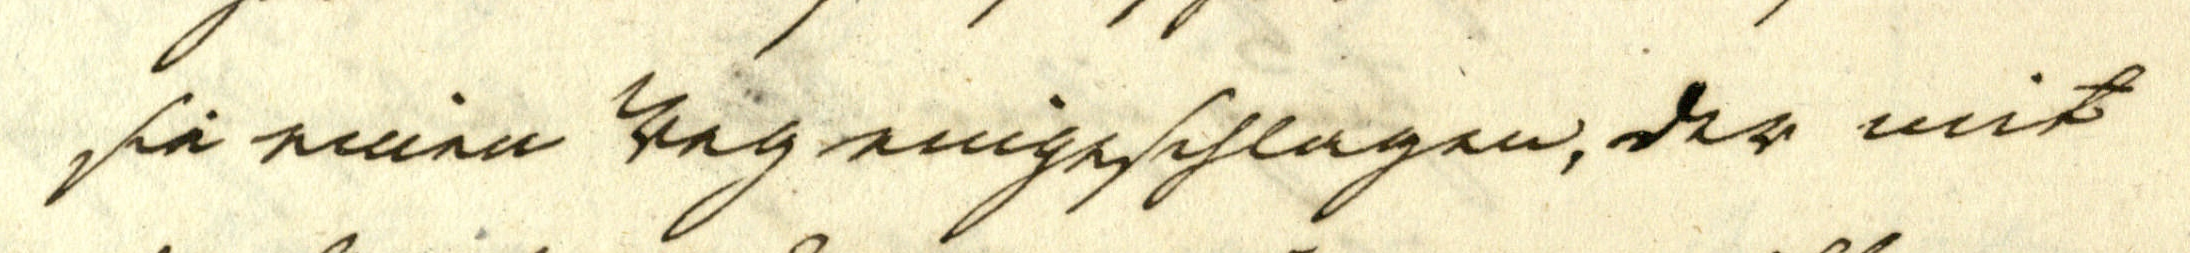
sie einen Weg einigeschlagen, der mit
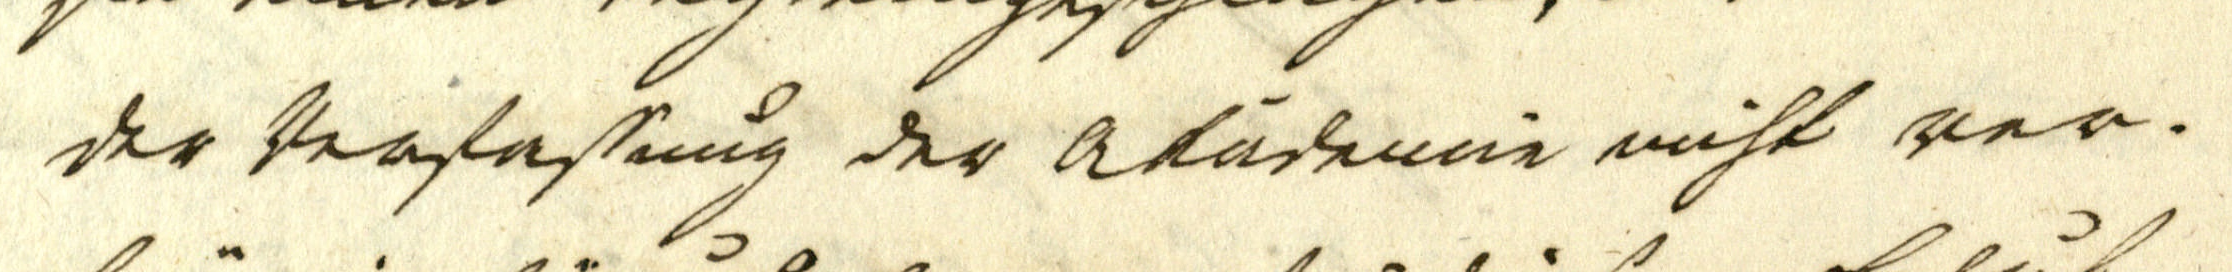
der Verfassung der Akademie nicht ver¬
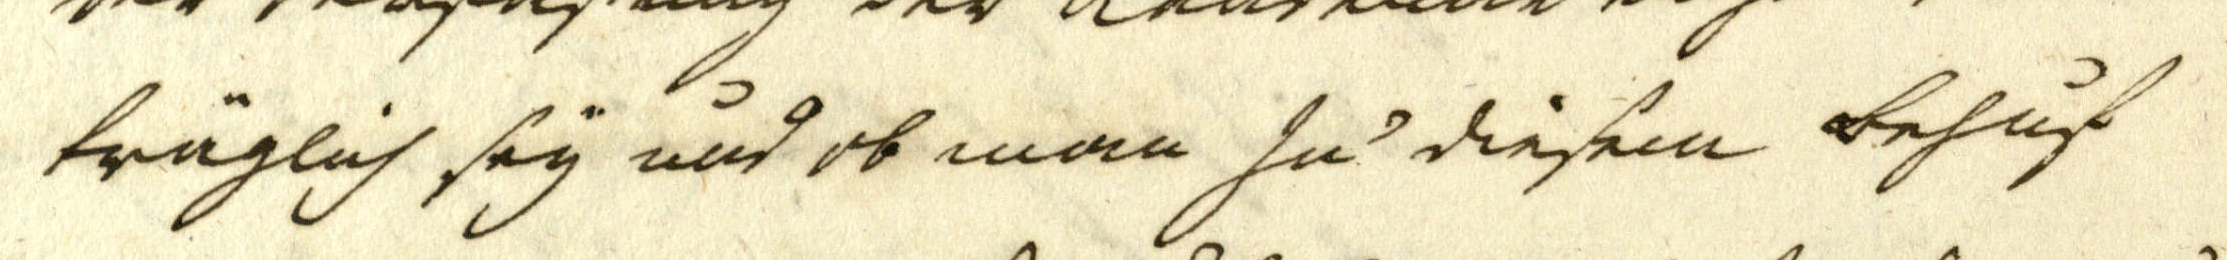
träglich seÿ und ob man zu diesem Behuf
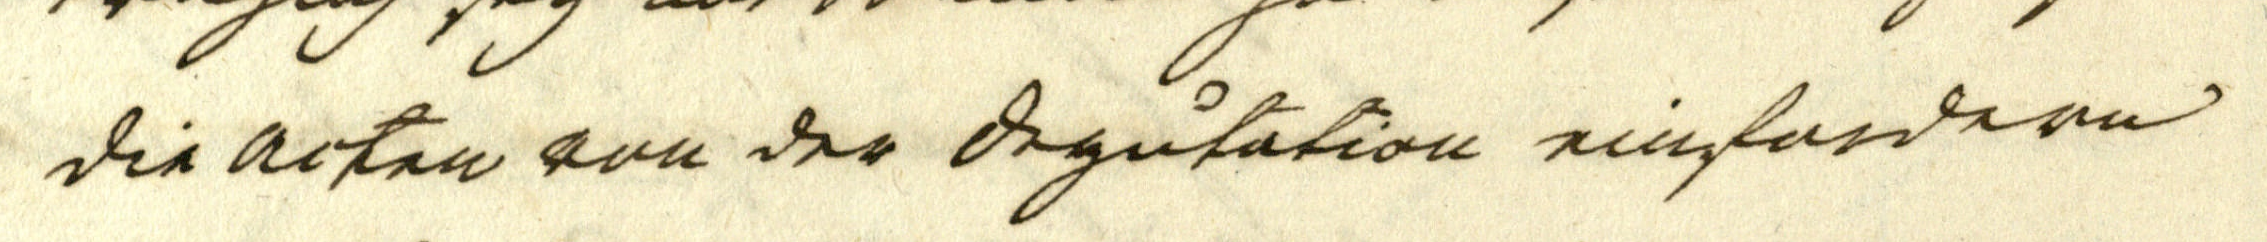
die Acten von der Deputation einfordern
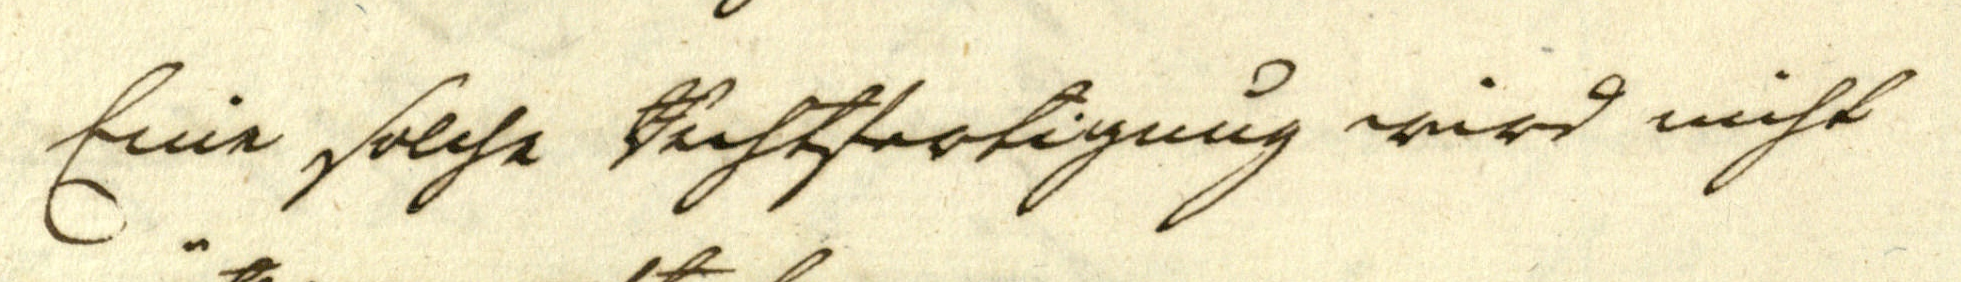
Eine solche Rechtfertigung wird nicht
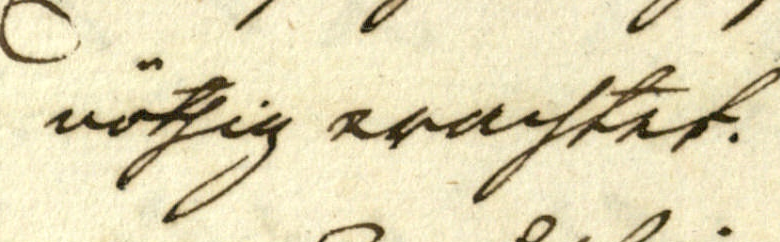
nöthig erachtet.
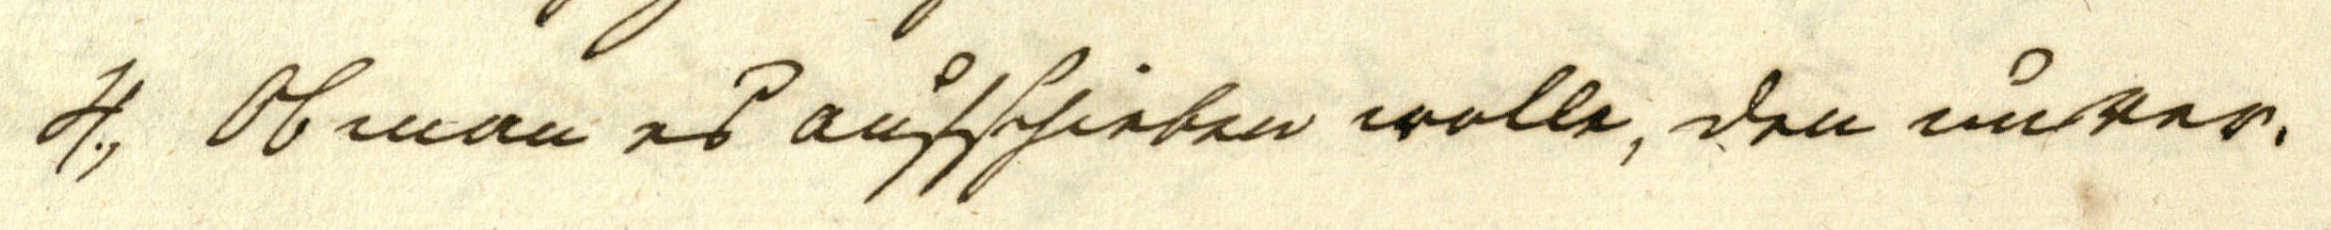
4., Ob man es aufschieben wolle, den unver¬
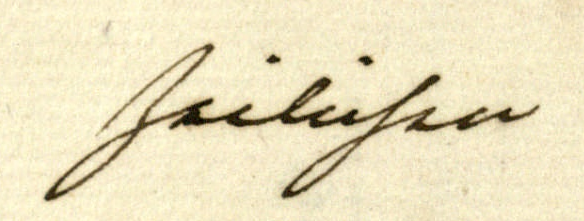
zeilichen
